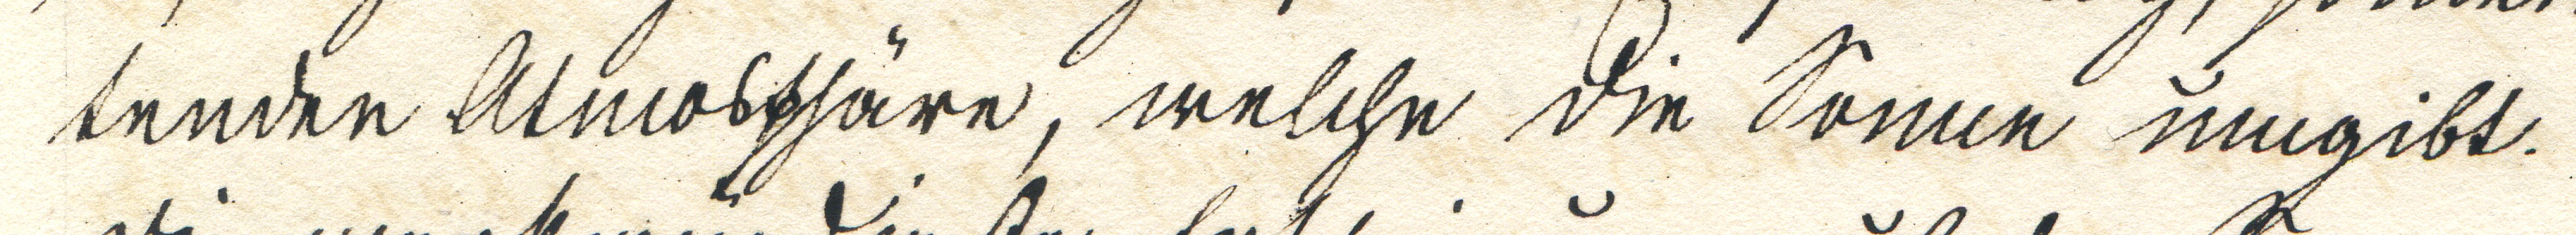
tenden Atmoshphäre, welche die Sonne umgibt.
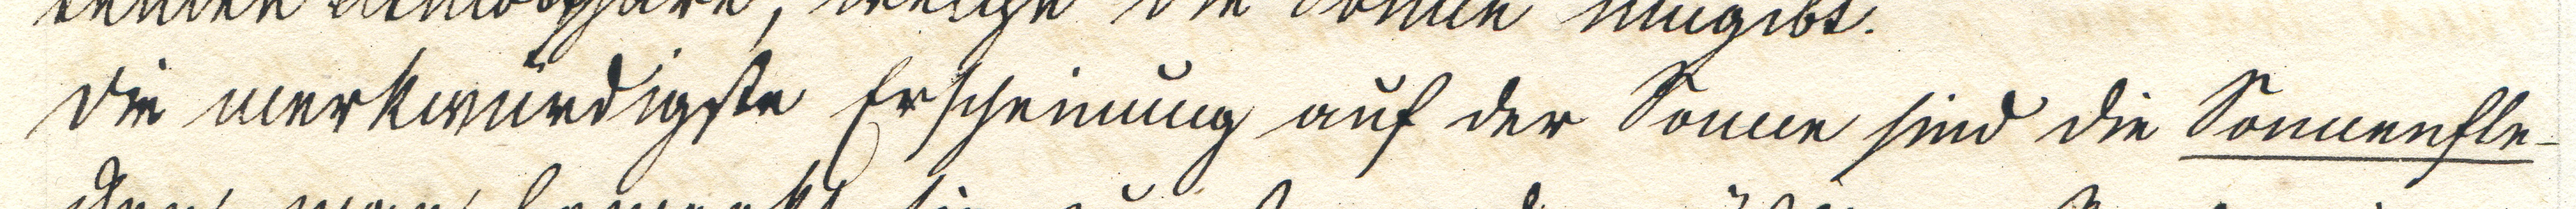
Die merkwürdigste Erscheinung auf der Sonne sind die Sonnenfle-
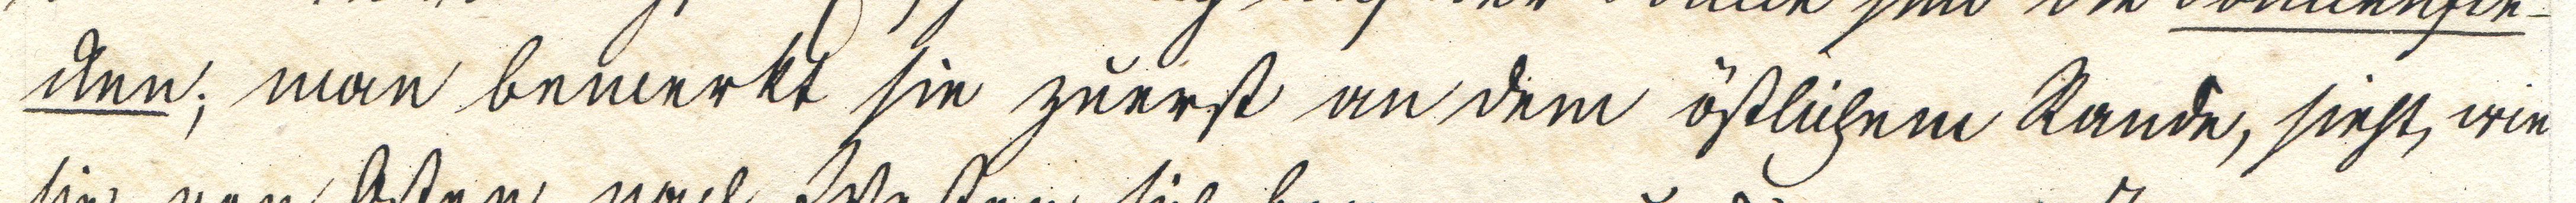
cken; man bemerkt sie zuerst an dem östlichen Rande, sieht, wie
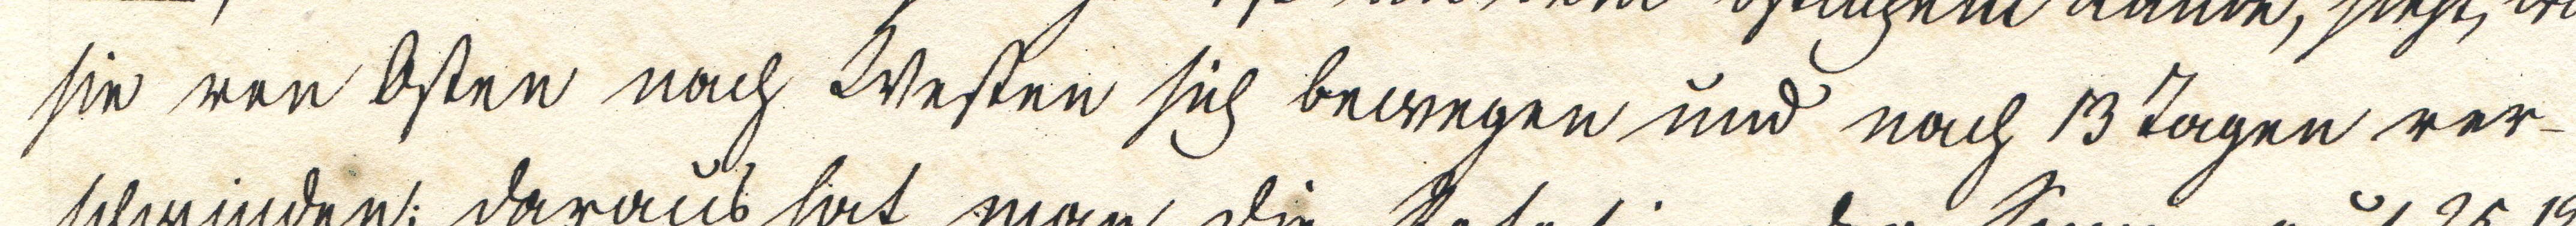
sie von Osten nach Westen sich bewegen und nach 13 Tagen ver-
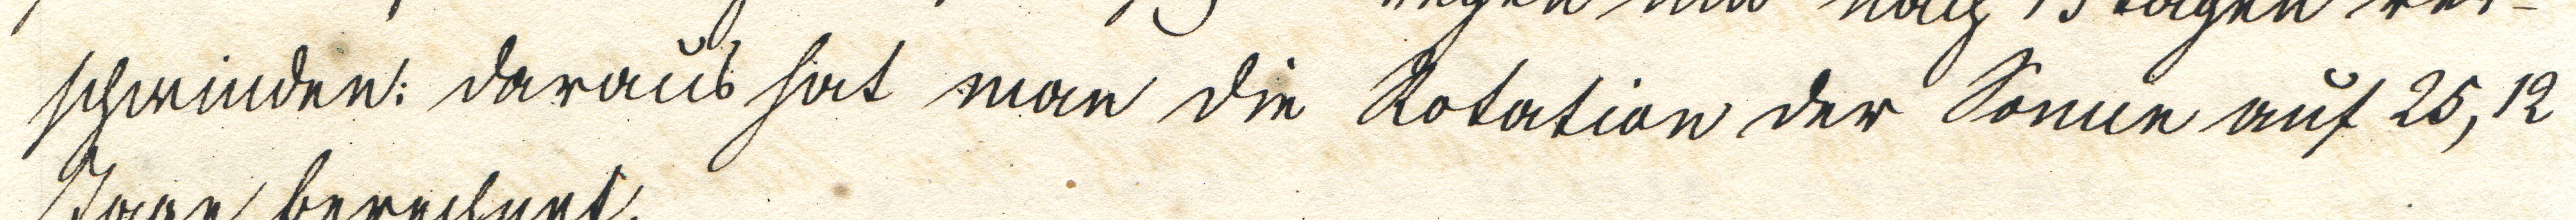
schwinden: Daraus hat man die Rotation der Sonne auf 25,12
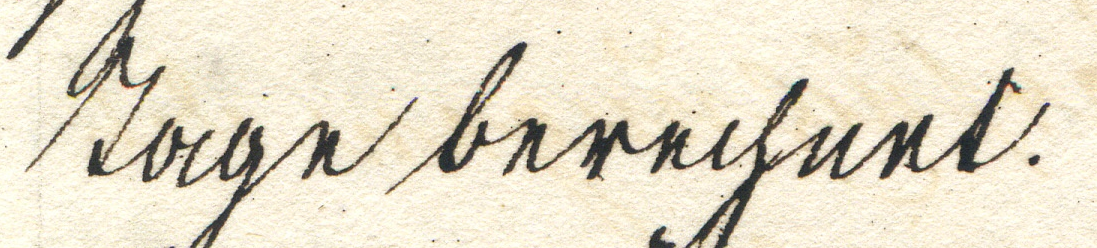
Tage berechnet.
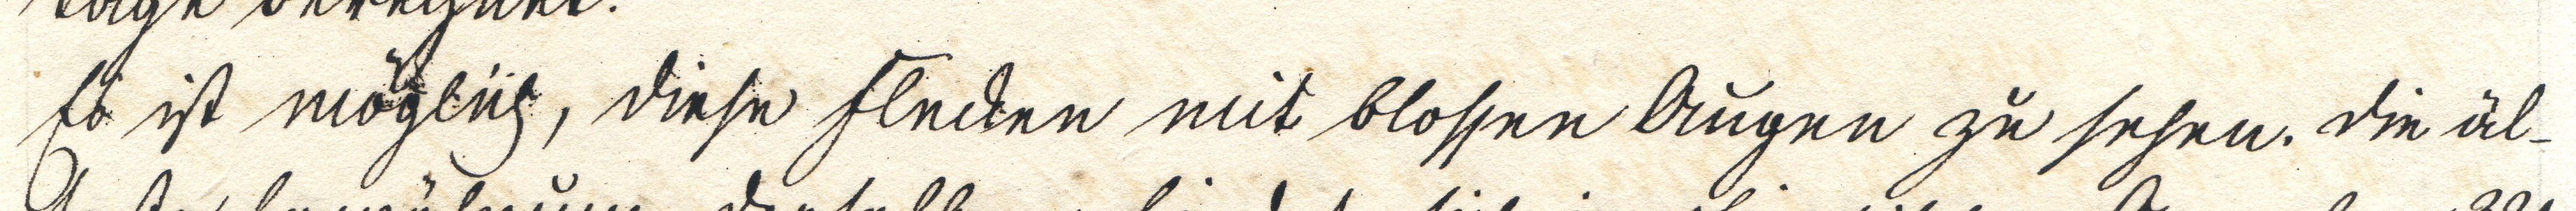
Es ist möglich, diese Flecken mit blossen Augen zu sehen. Die äl-
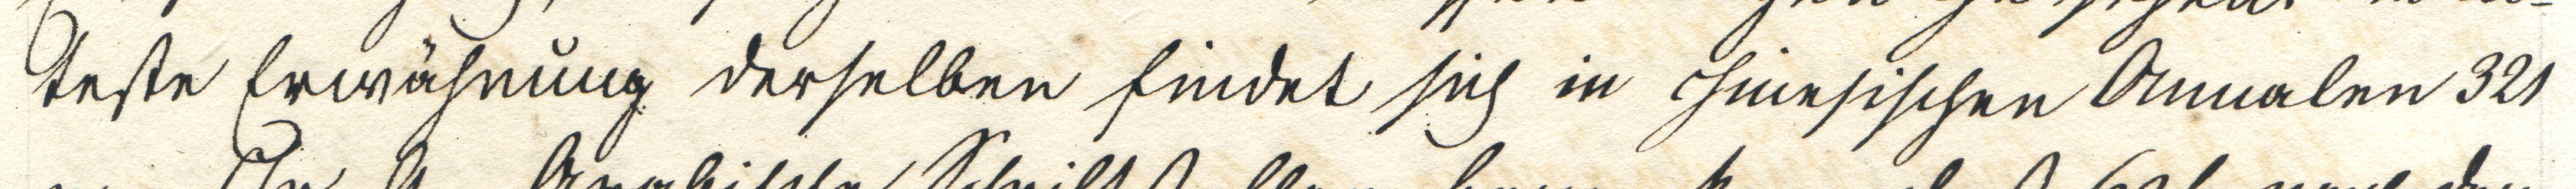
teste Erwähnung derselben findet sich in chinesischen Annalen 321
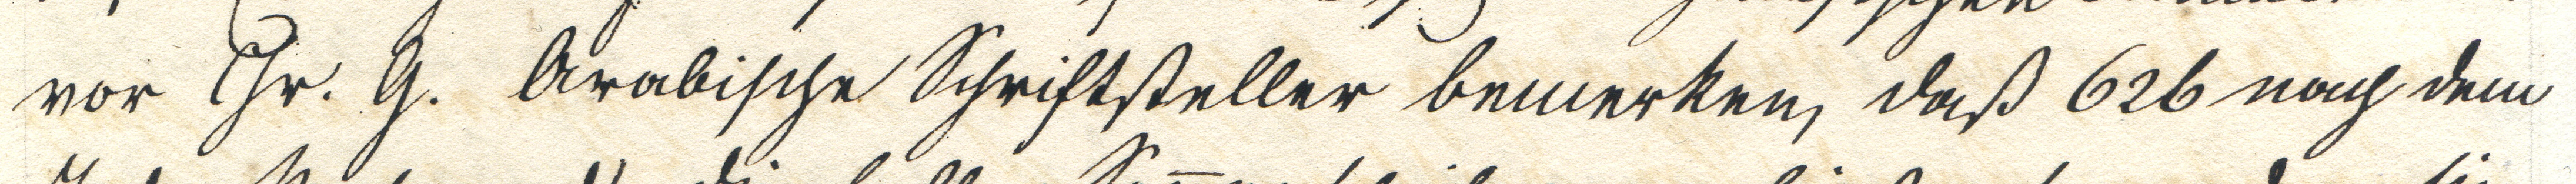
vor Chr. G. Arabische Schriftsteller bemerken, daß 626 nach dem
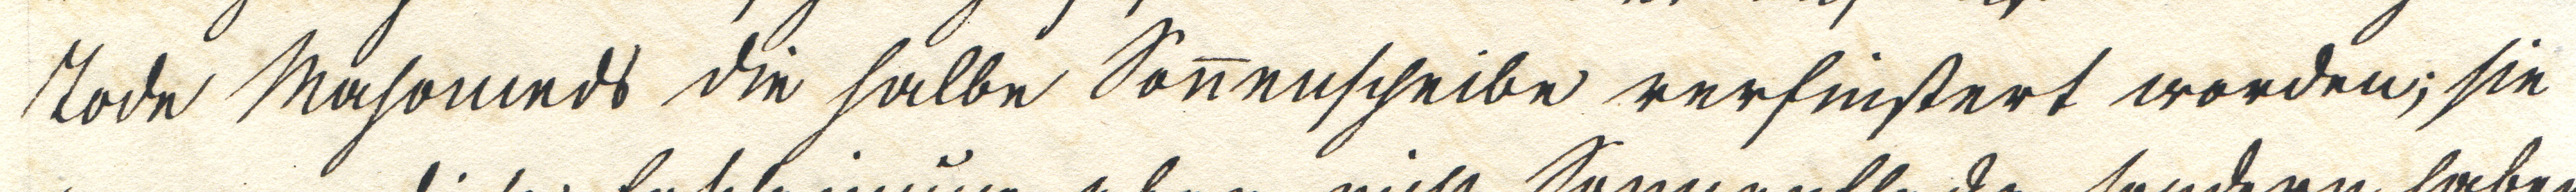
Tode Mohameds die halbe Soñenscheibe verfinstert worden; sie
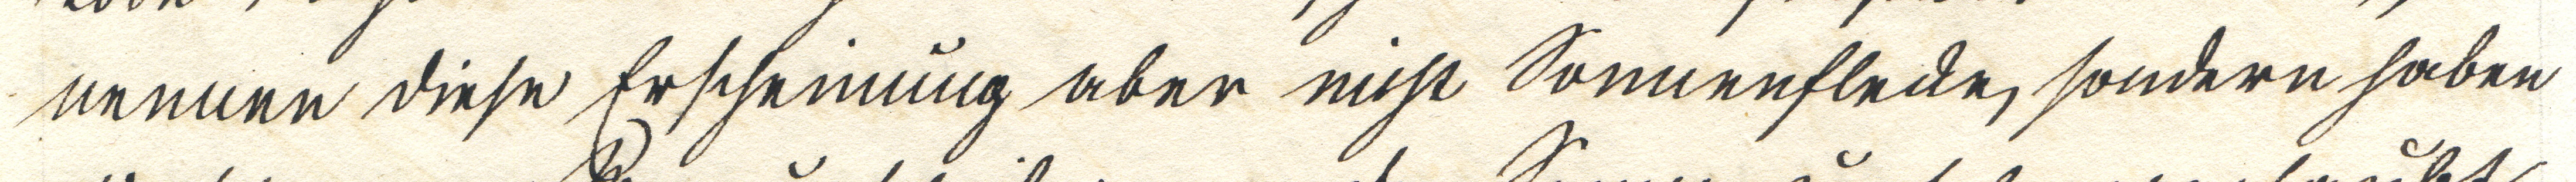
nennen diese Erscheinung aber nicht Sonnenflecke, sondern haben
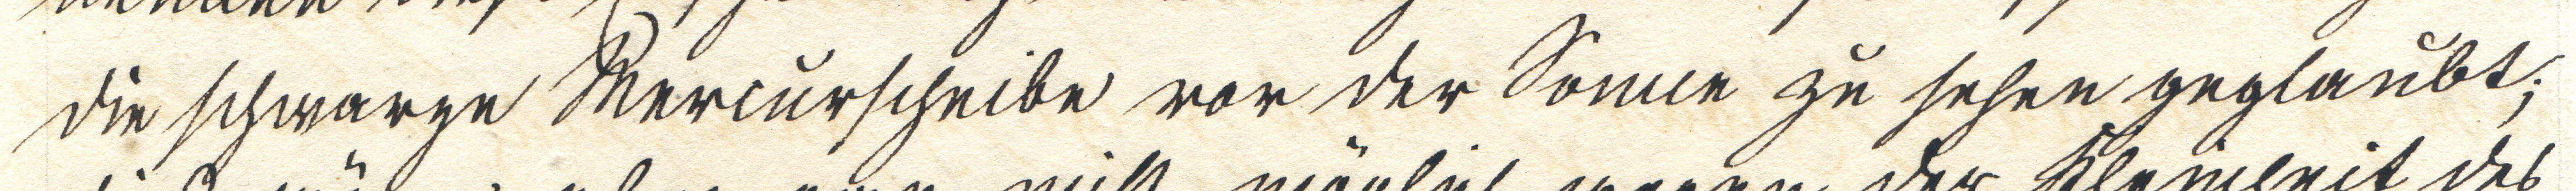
die schwarze Mercurscheibe vor der Sonne zu sehen geglaubt;
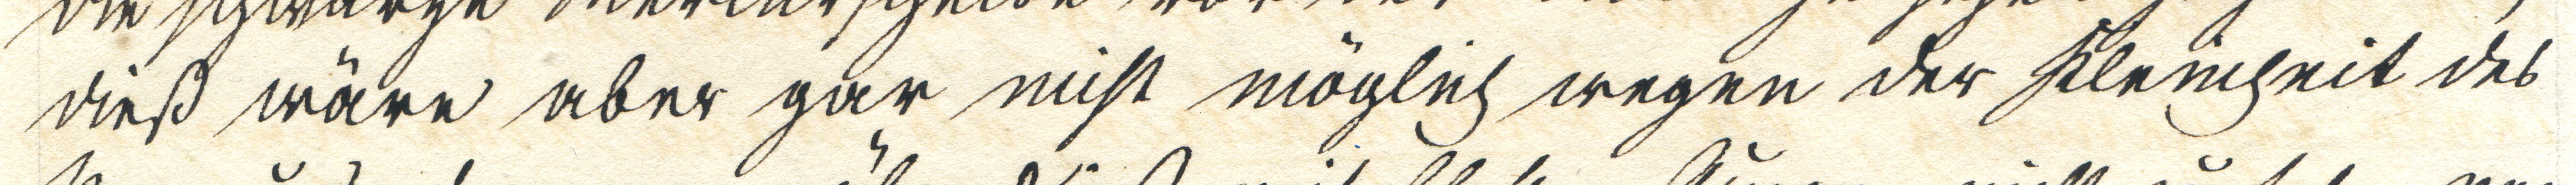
dieß wäre aber gar nicht möglich wegen der Kleinheit des
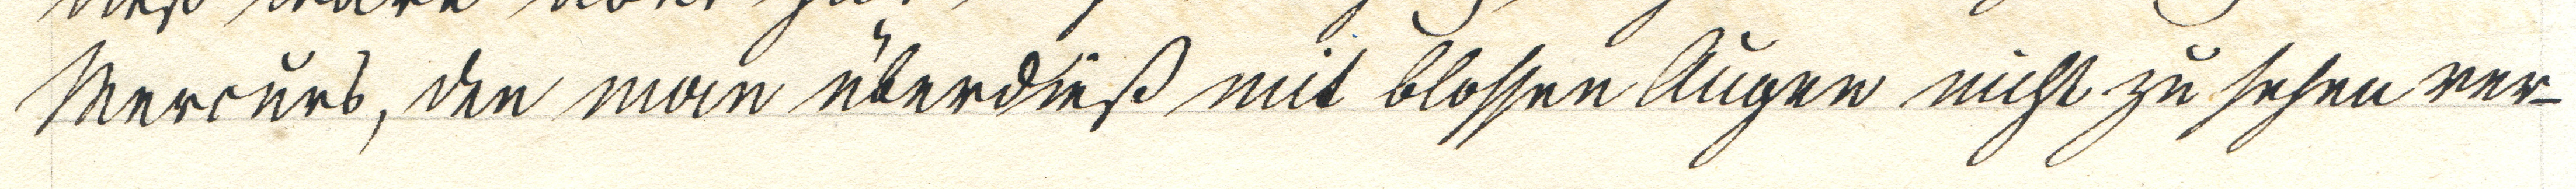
Mercurs, den man überdieß mit blossen Augen nicht zu sehen ver-
